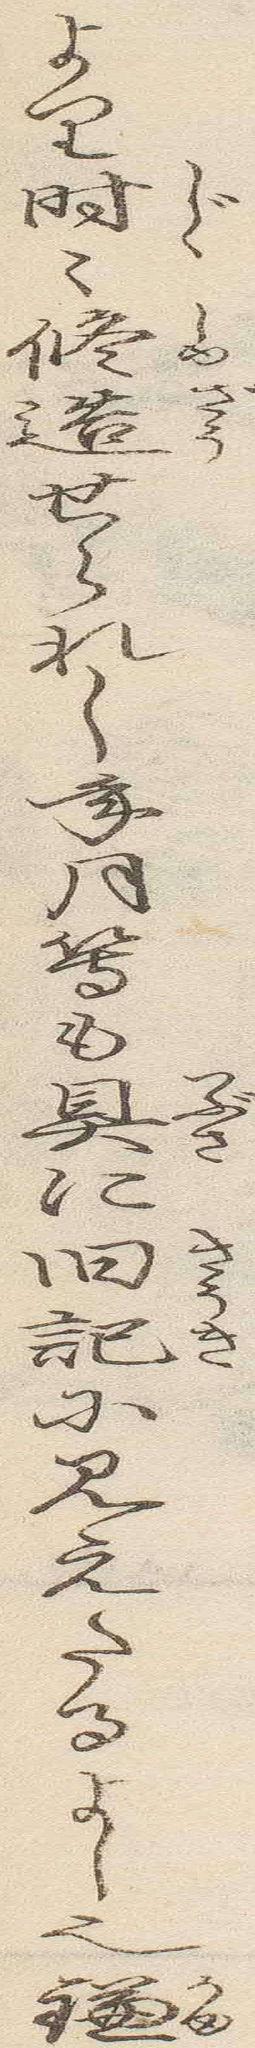より时〻修造せられし年月等も具に旧記に見えたるよし也鎌
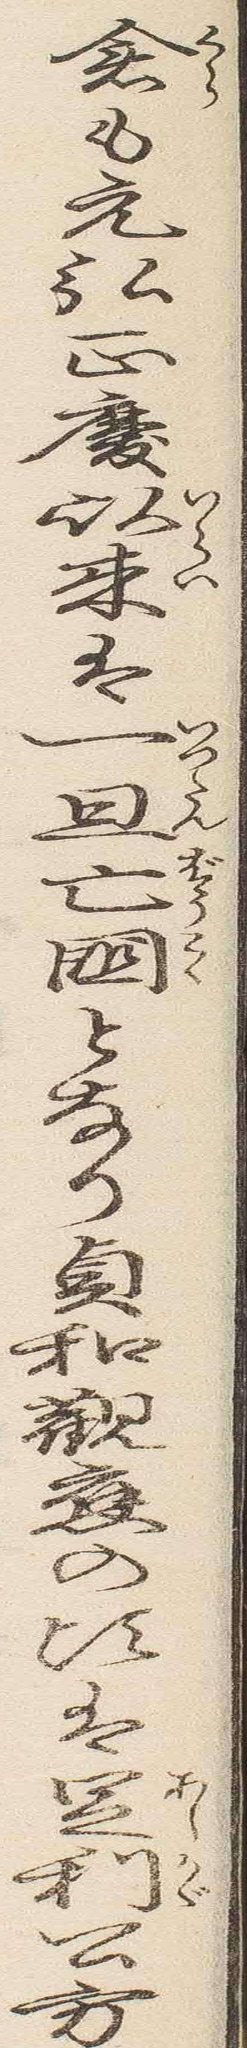倉も元弘正慶以来は一旦亡國となり貞和觀應の頃は足利公方
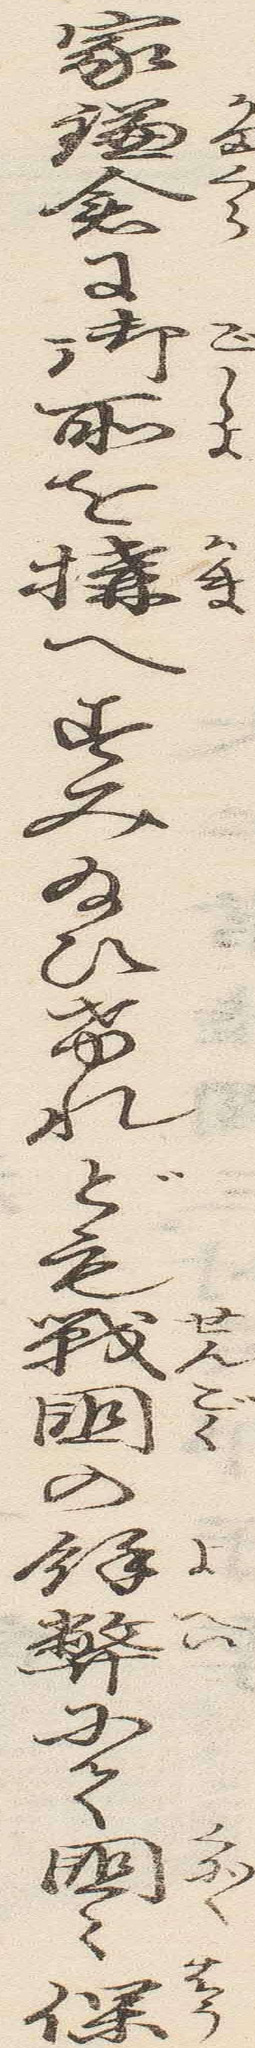家鎌倉に御所を構へすみ給ひけれども戦國の餘弊にて國〻保
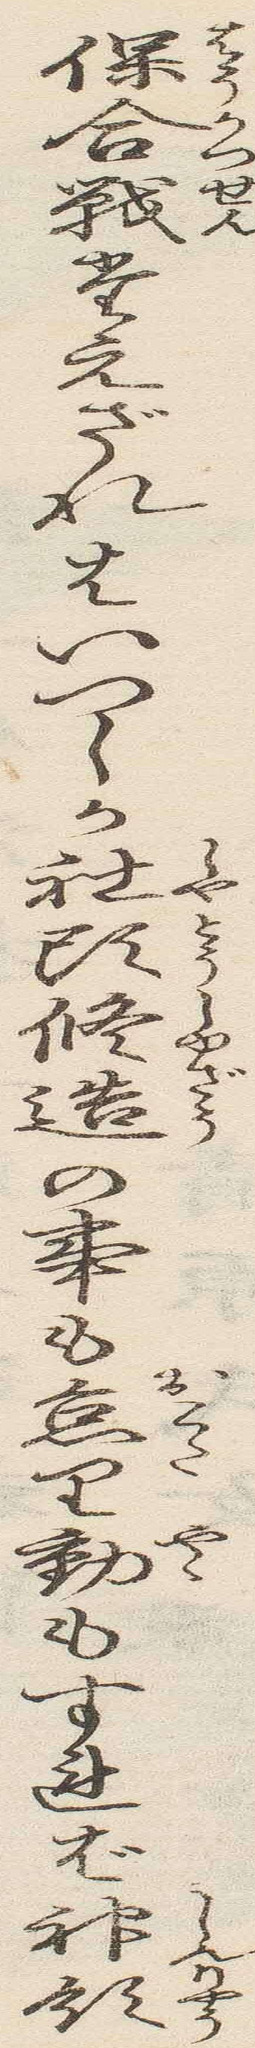保合戦たえざれはいつしか社頭修造の事も怠り動もすれば神領
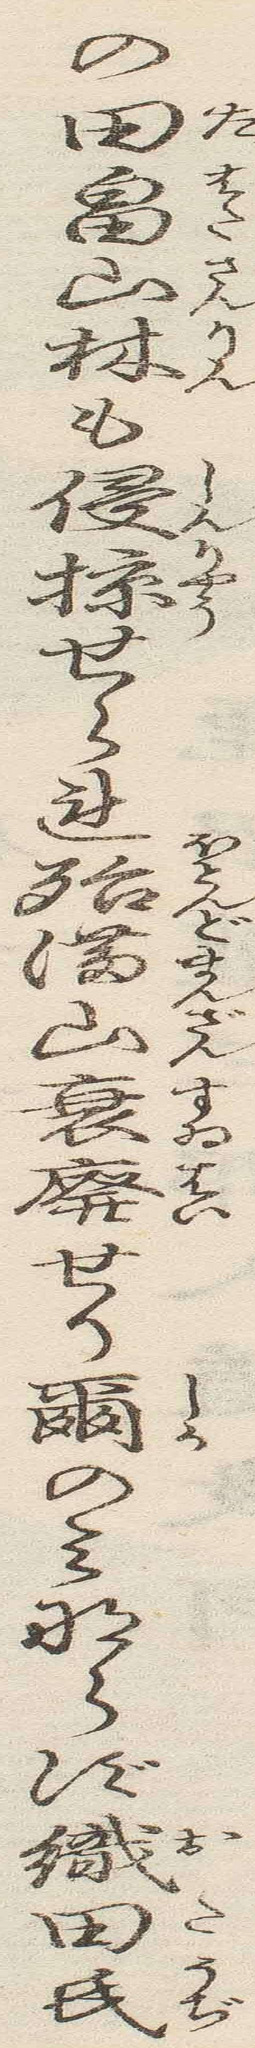の田畠山林も侵掠せられ殆満山衰廃せり爾のみならず織田氏
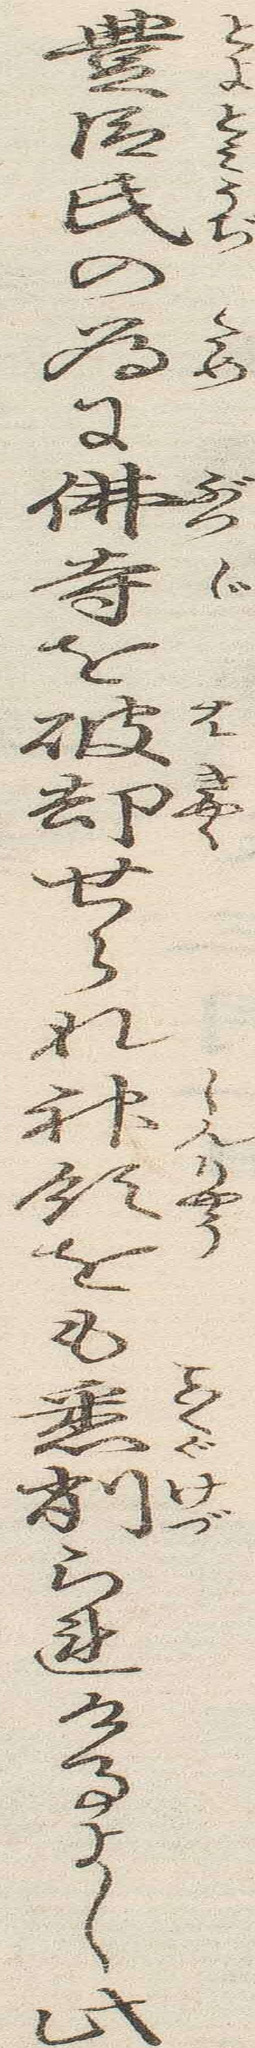豊臣氏の為に佛寺を破却せられ神領をも悉削られけるよし此
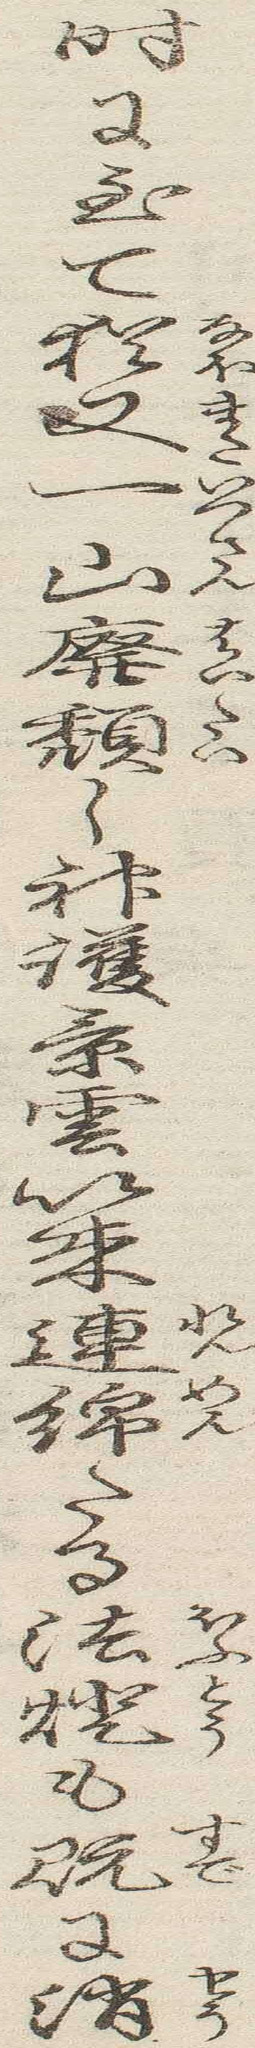时に至て猶又一山廃頽し神護景雲以来連綿たる法燈も既に消
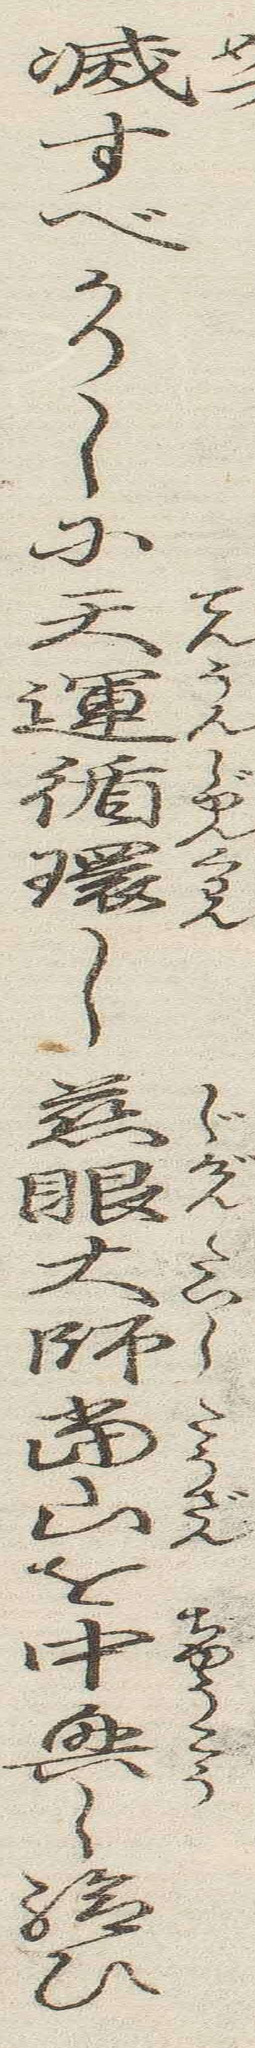滅すべかりしに天運循環し慈眼大師當山を中興し給ひ
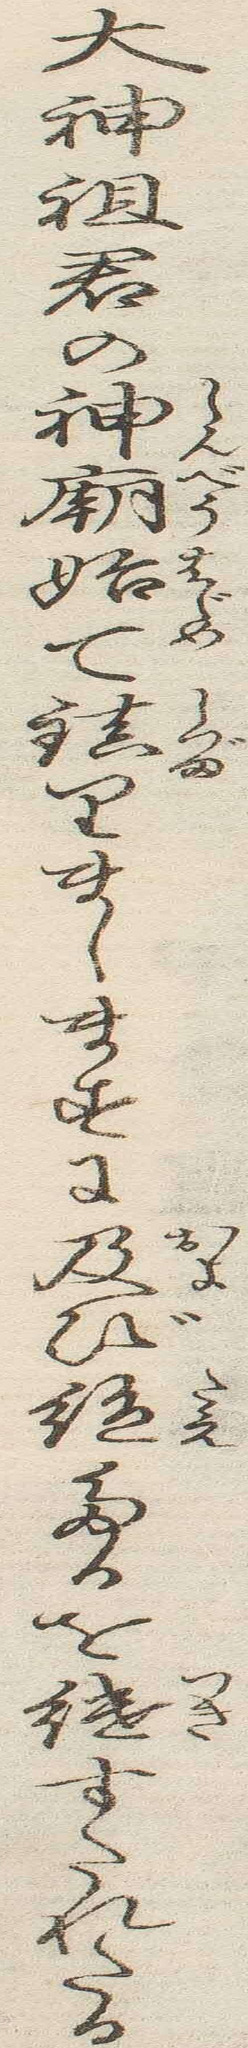大神祖君の神廟始て鎮りましますに及び絶たるを継すたれたる
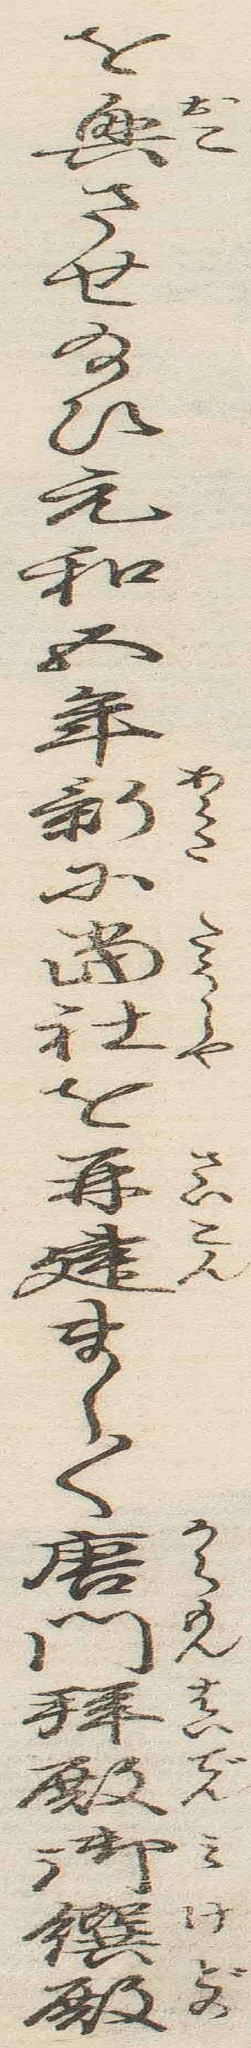を興させ給ひ元和五年新に當社を再建まし〳〵唐門拜殿御饌殿
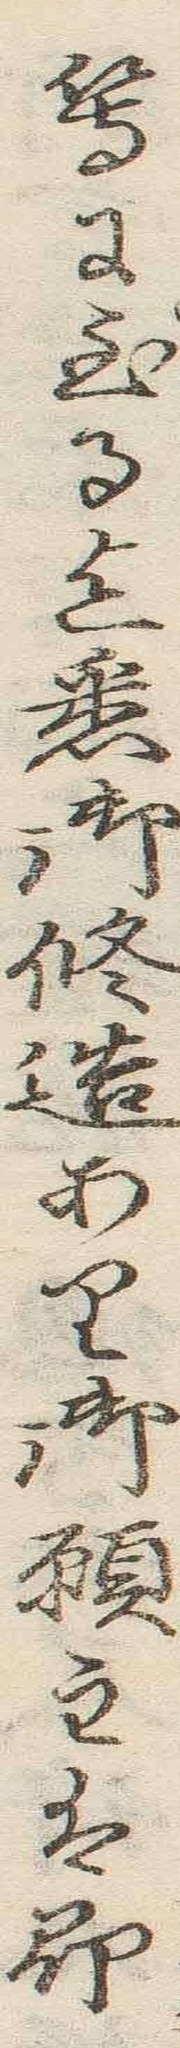等に至る迄悉御修造あり御願主は即
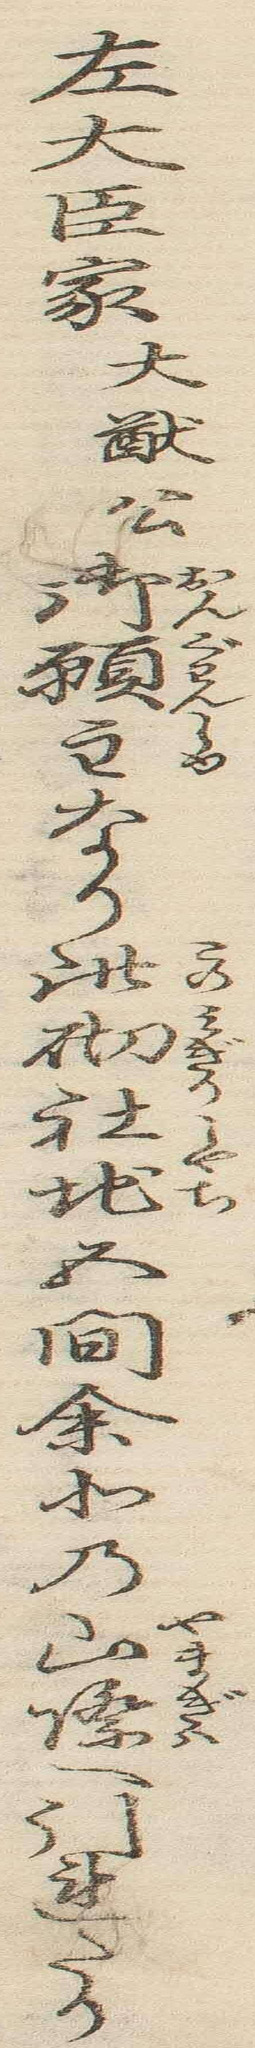左大臣家大猷公御願主なり此砌社地五間余北の山際へ引れたり

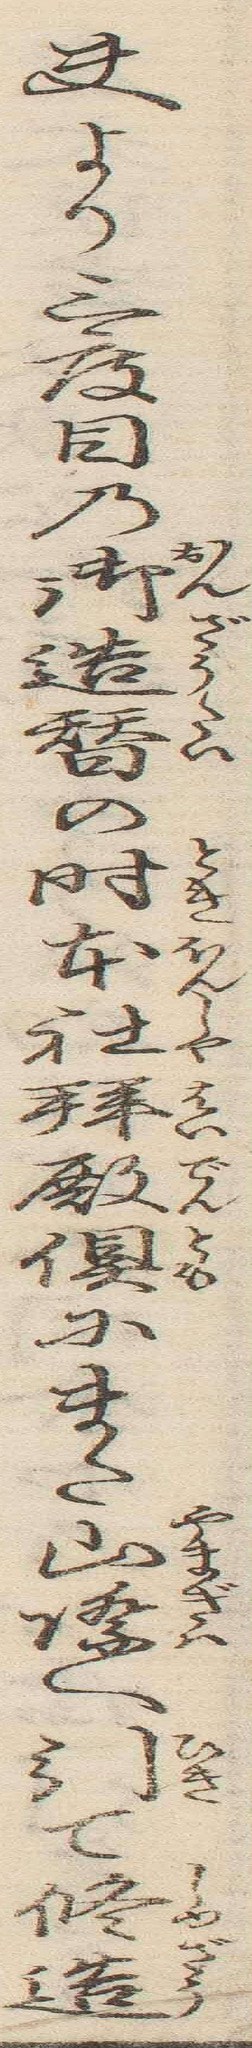夫より三度目の御造替の时本社拜殿倶にまた山際へ引て修造
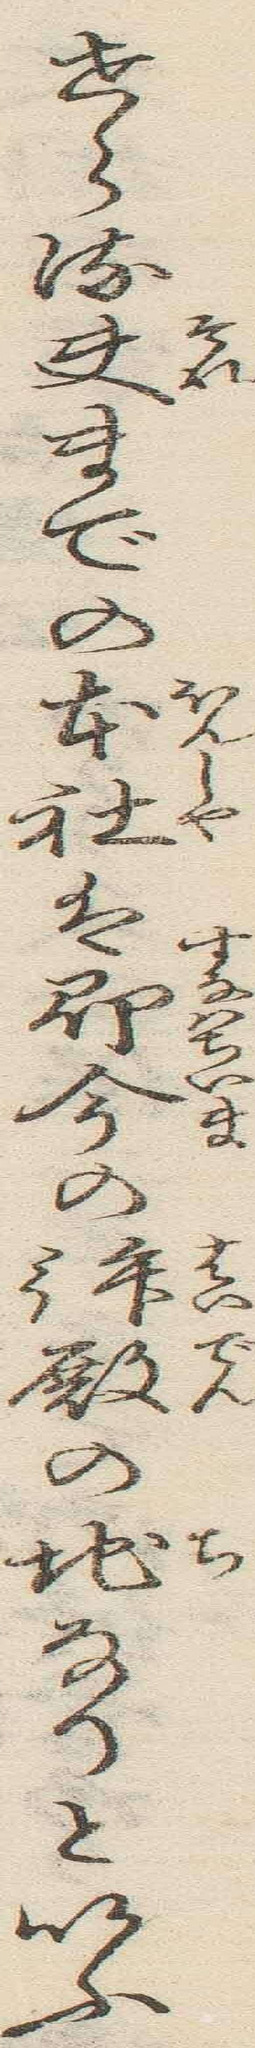せらる夫までの本社は即今の拜殿の地なりといふ
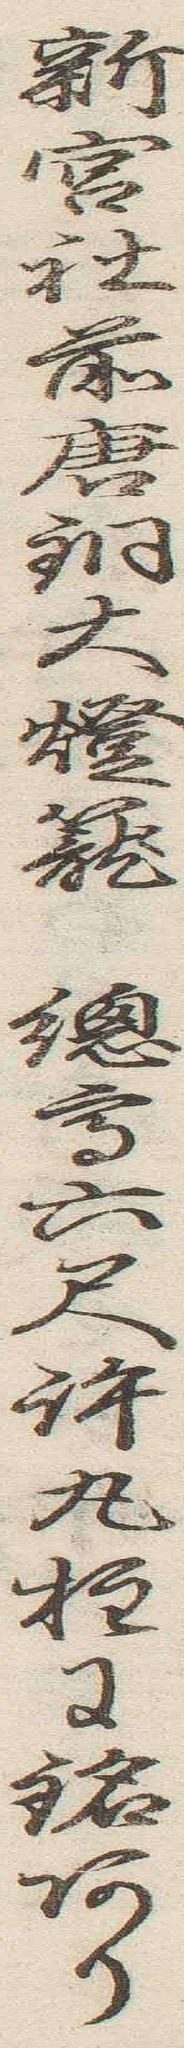新宮社前唐銅大燈籠總高六尺許丸柱に銘あり
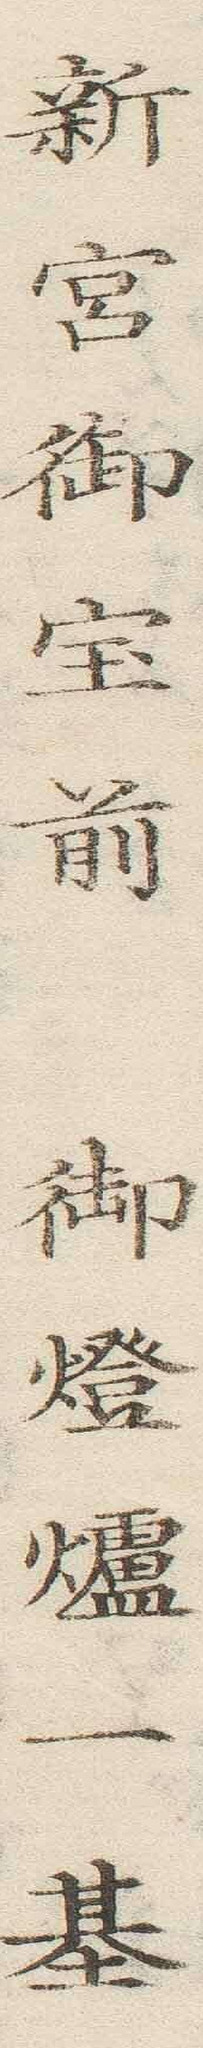新宮御宝前御燈爐一基
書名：日光山志
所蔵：東京学芸大学附属図書館 国文学研究資料館
